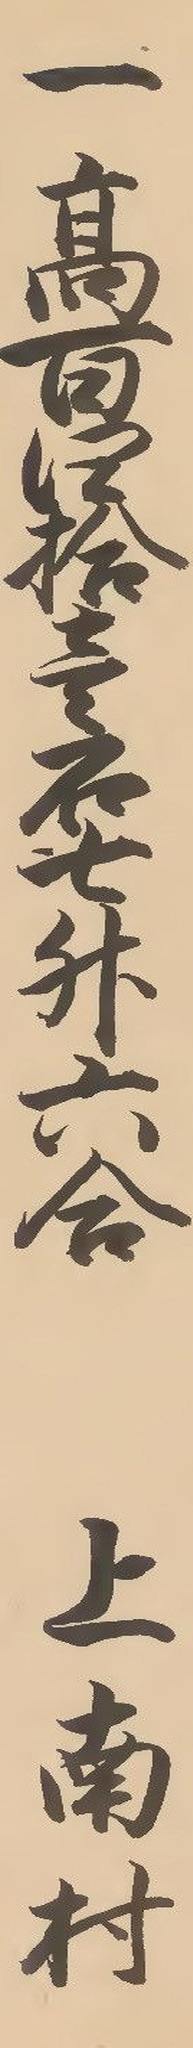一髙百四拾壱石七升六合上南村
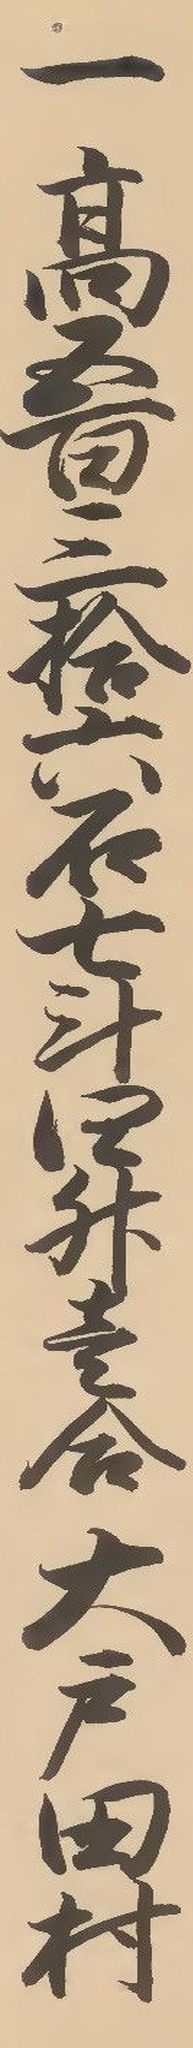一髙五百三拾六石七斗四升壱合大戸田村
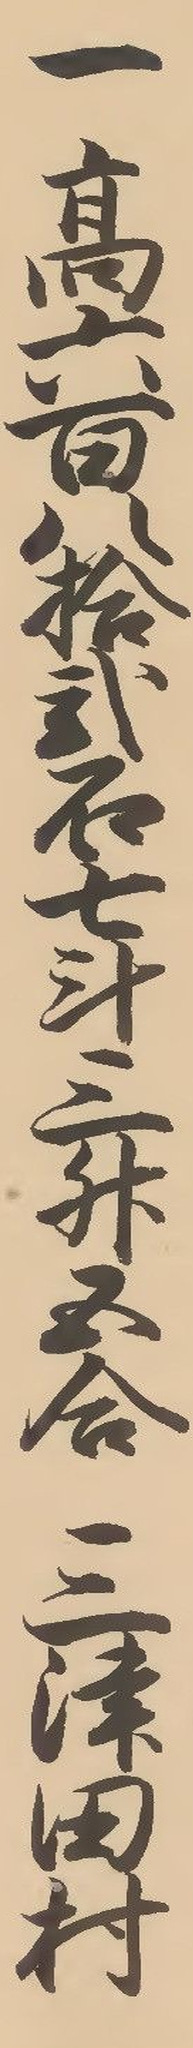一髙六百八拾弐石七斗三升五合三津田村

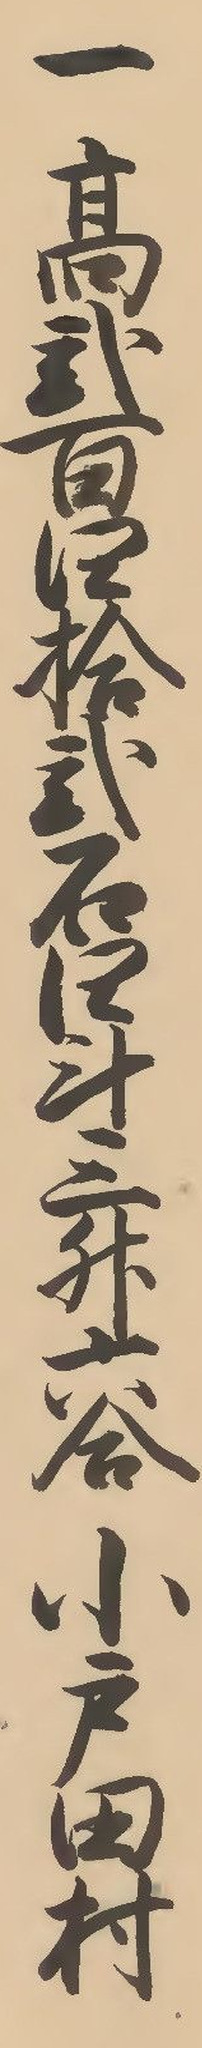一髙弐百四拾弐石四斗三升六合小戸田村
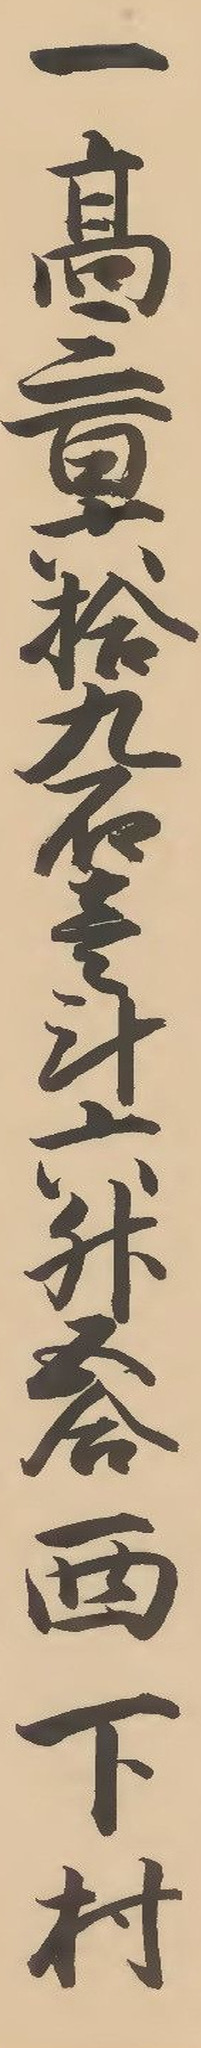一髙三百六拾九石壱斗六升五合西下村
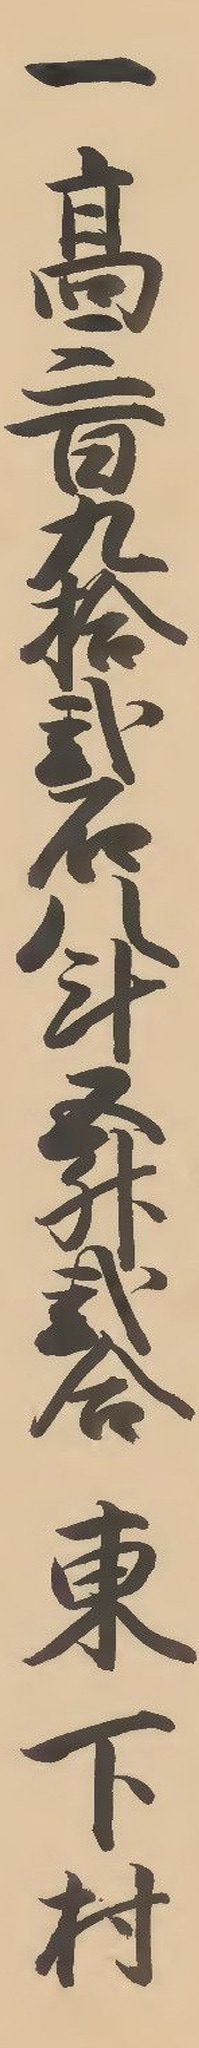一髙三百九拾弐石八斗五升弐合東下村
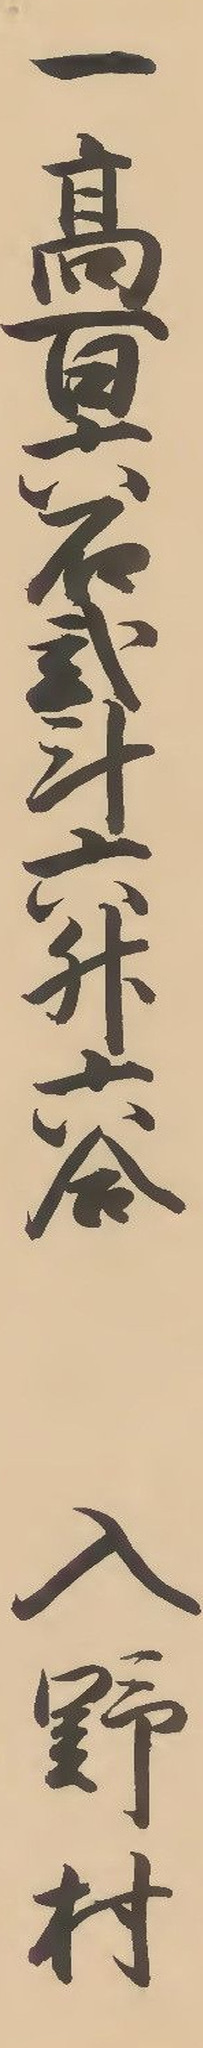一髙百六石弐斗六升六合入野村
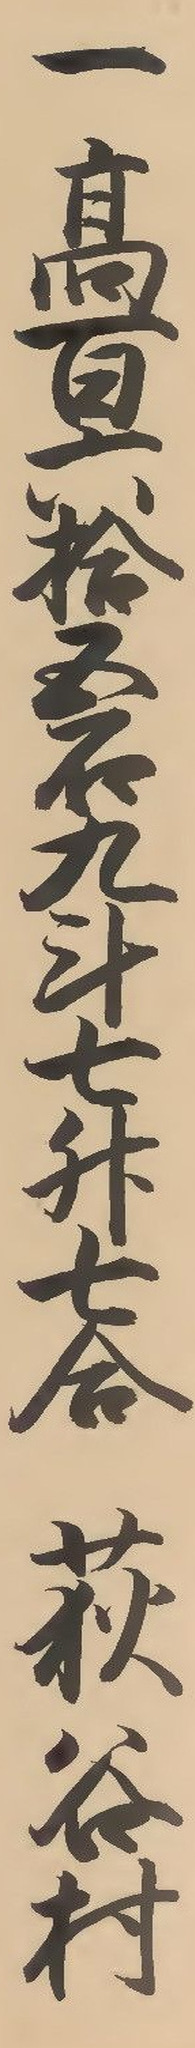一髙百六拾五石九斗七升七合萩谷村
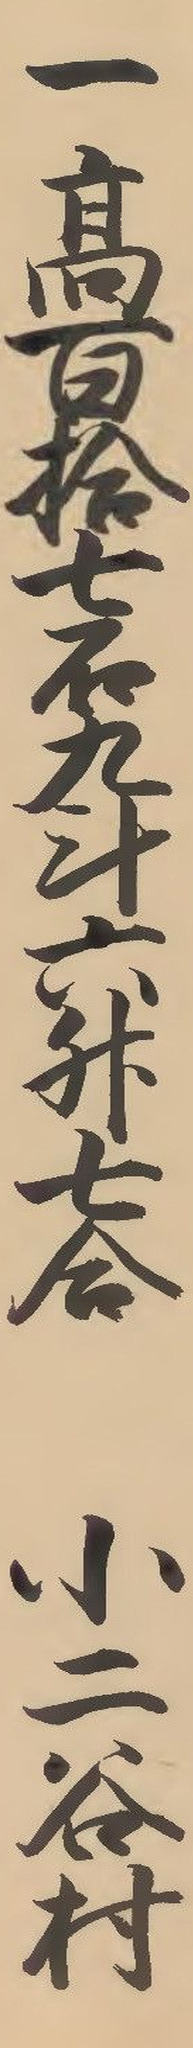一髙百拾七石九斗六升七合小二谷村
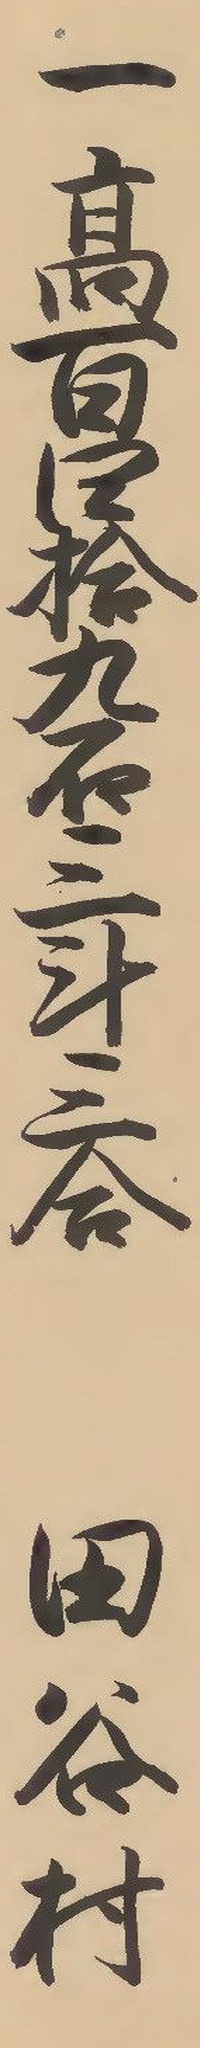一髙百四拾九石三斗三合田谷村
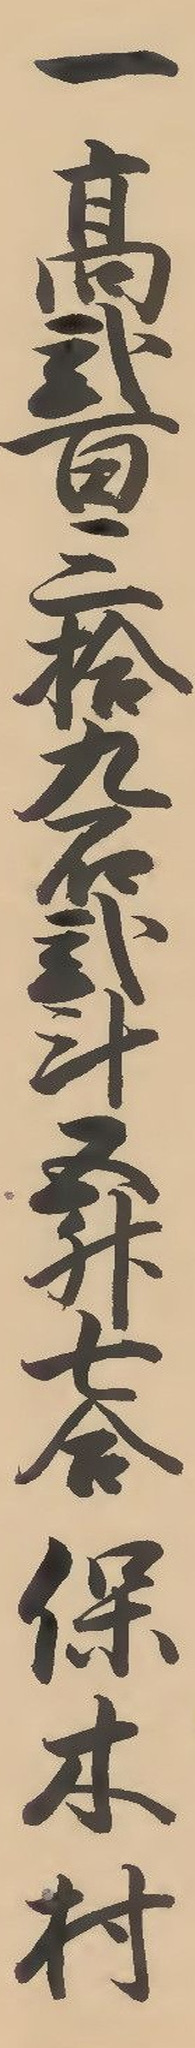一髙弐百三拾九石弐斗五升七合保木村

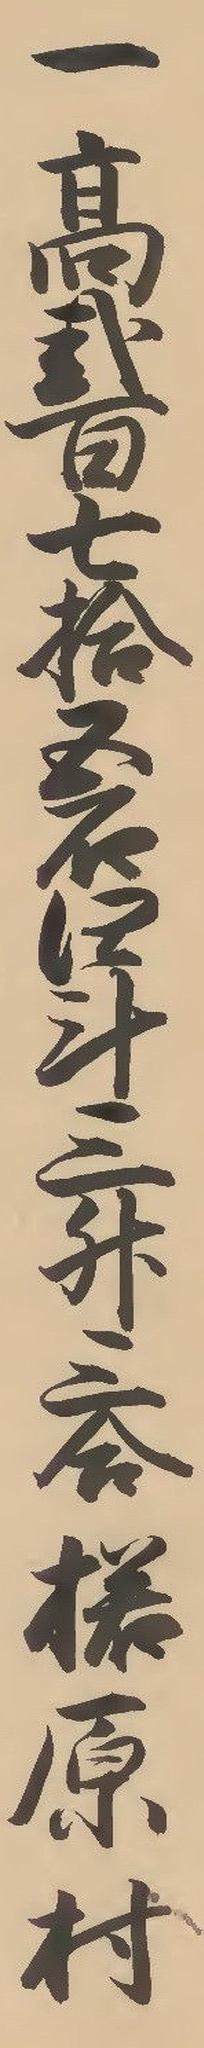一髙弐百七拾五石四斗三升三合原村
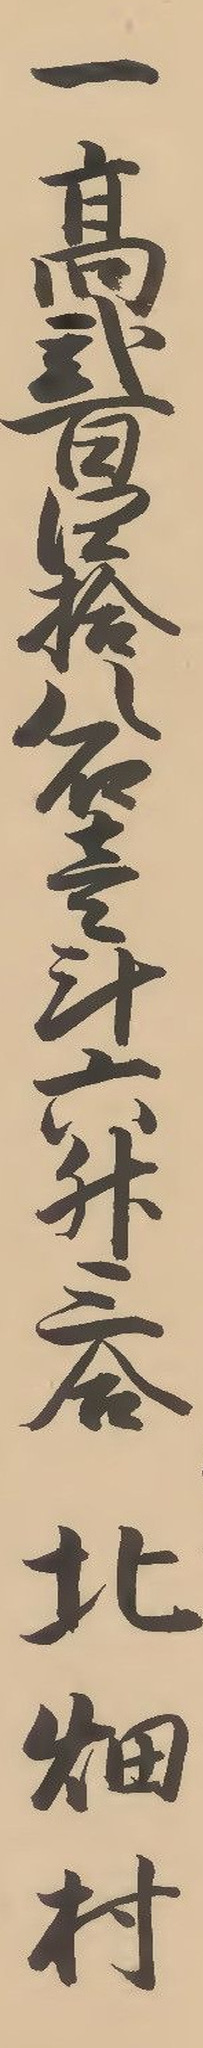一髙弐百四拾八石壱斗六升三合北畑村
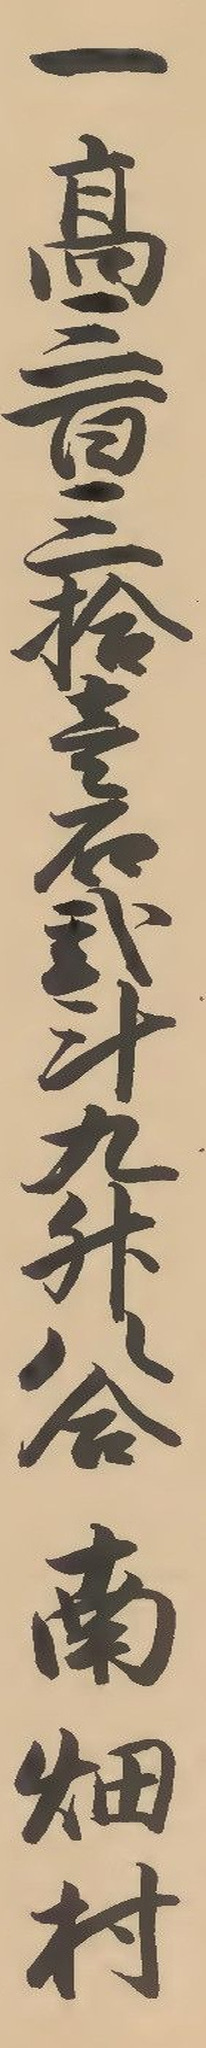一髙三百三拾壱石弐斗九升八合南畑村
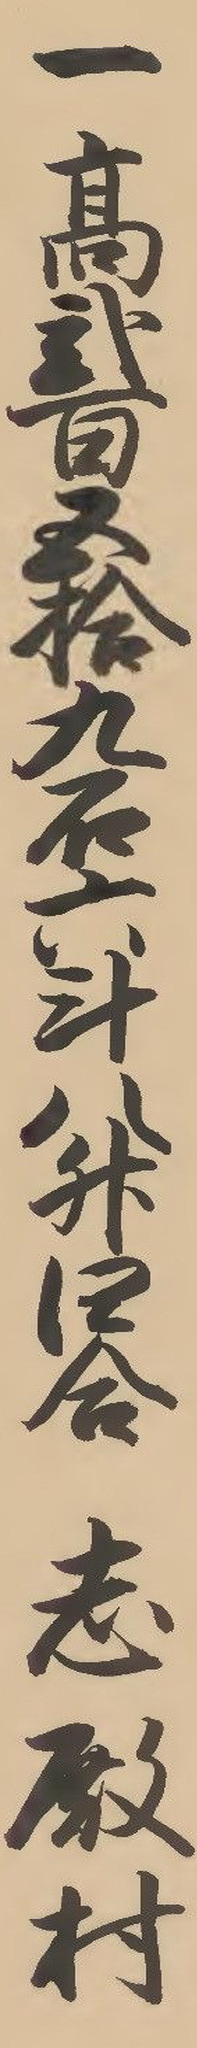一髙弐百五拾九石六斗八升四合志殿村
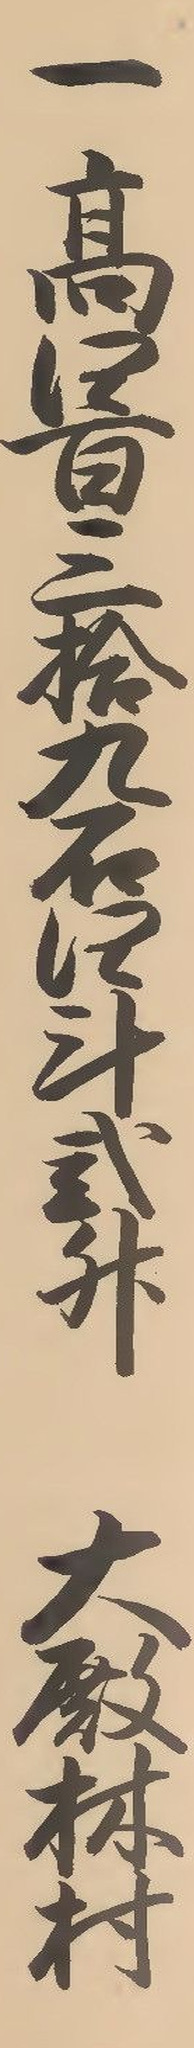一髙四百三拾九石四斗弐升大殿林村
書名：播磨国郷帳
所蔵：国立公文書館 National Archives of Japan
